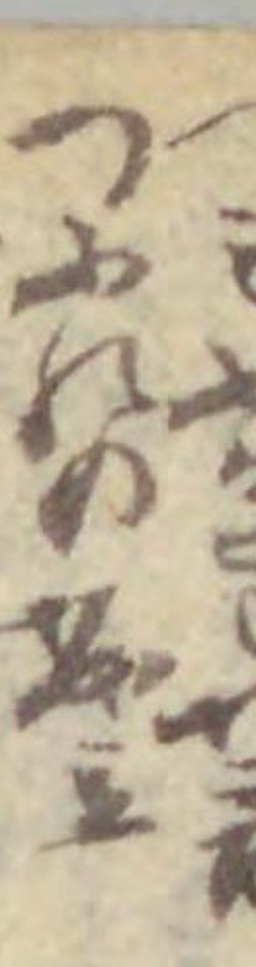つふれの掘立
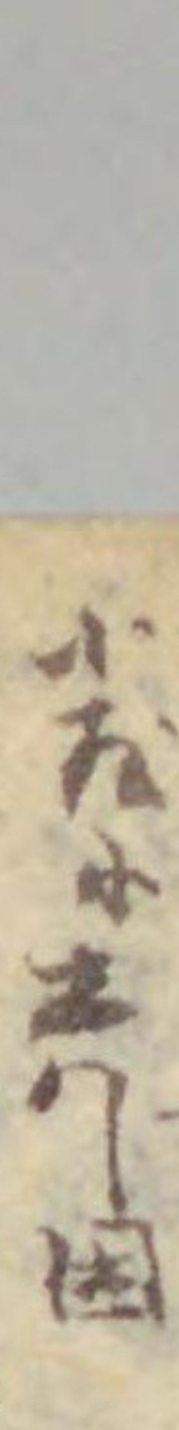小屋にしハし困
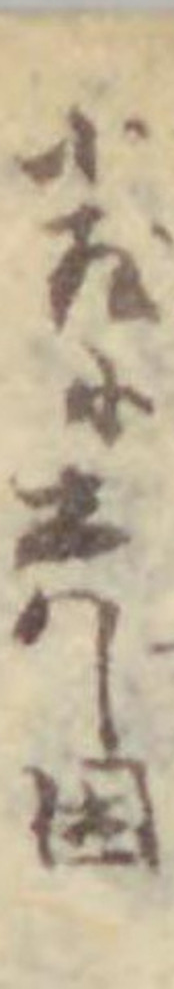小屋にしハし困
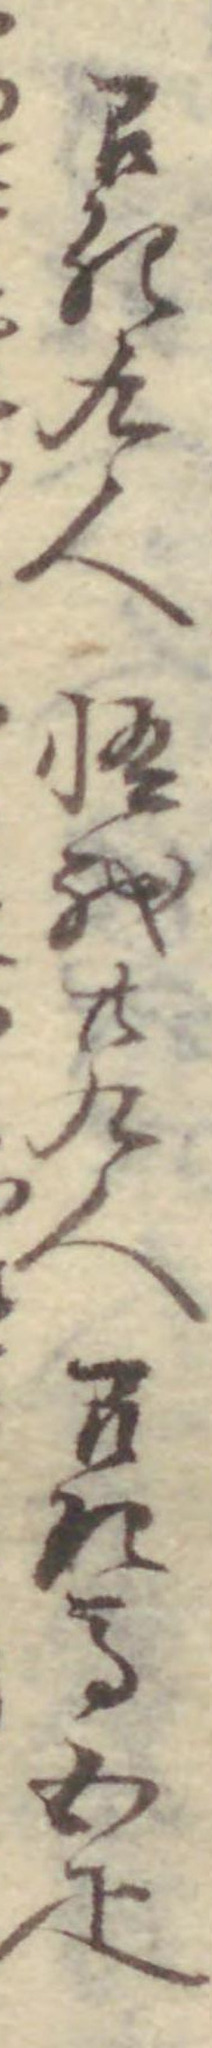即死九人怪我廿九人即死馬五疋
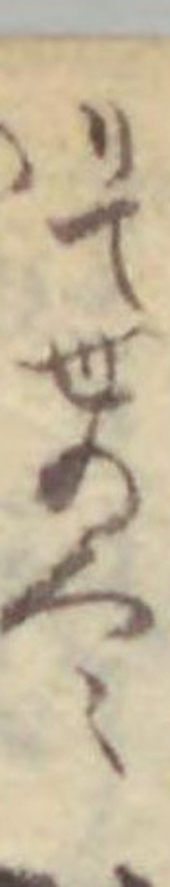りて世の人々
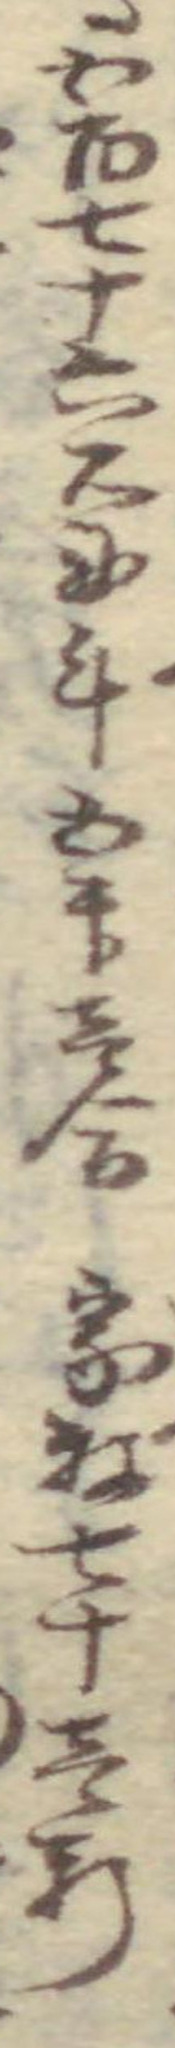高五百七十六石弐斗五升壱合家数七十壱軒
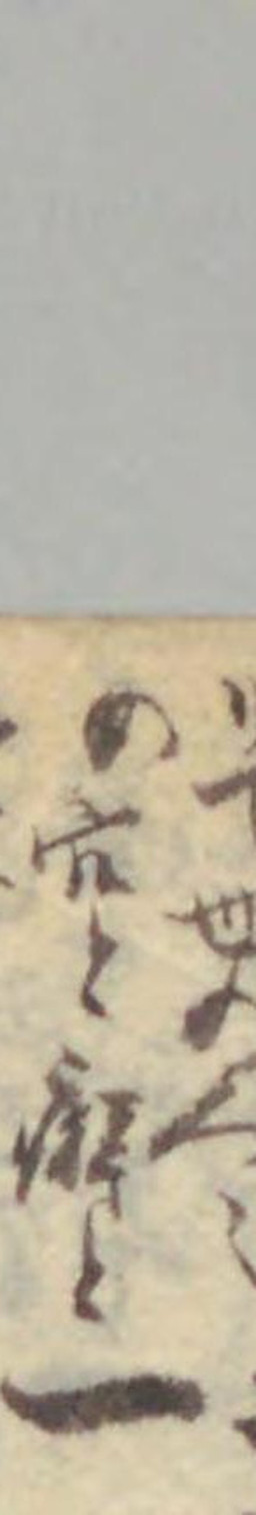の穴と癖と
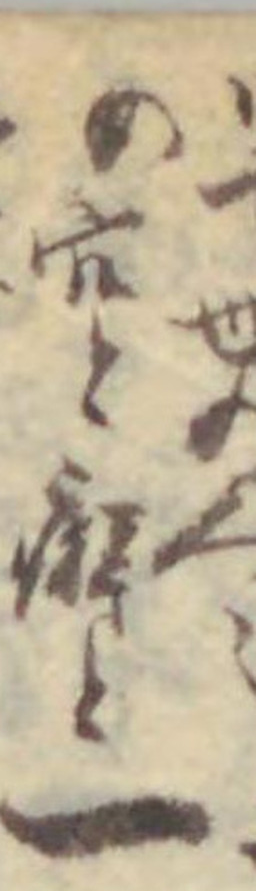の穴と癖と
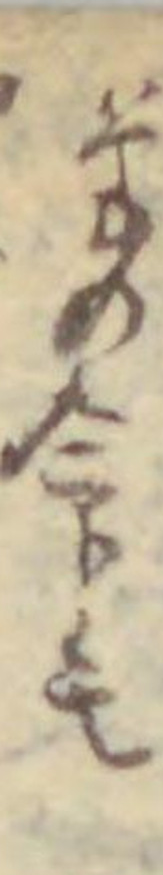筆の命も
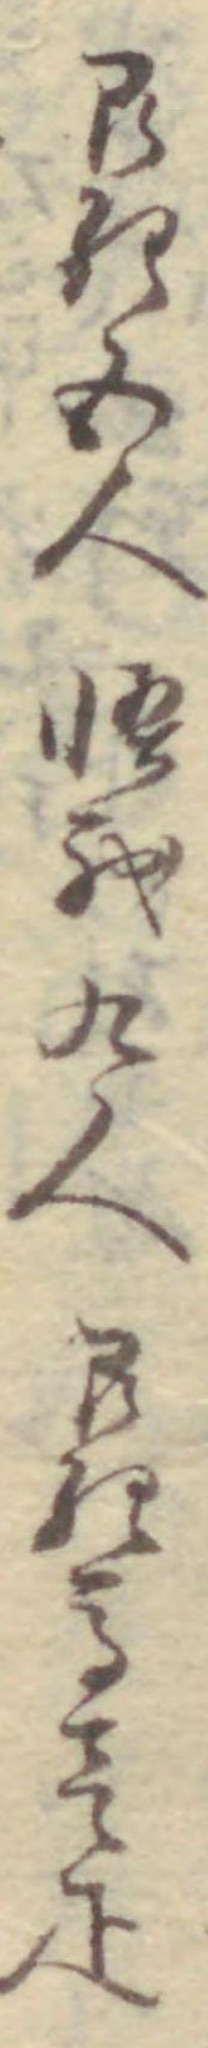即死五人怪我九人即死馬壱疋
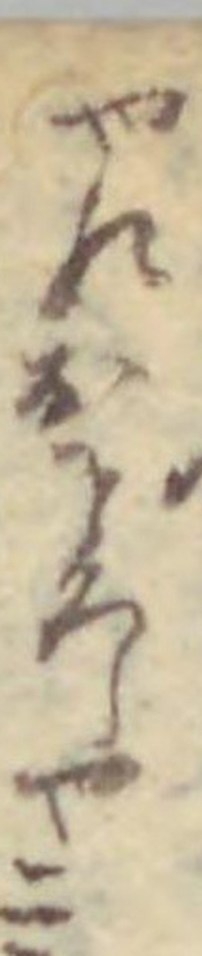やれおそろしや
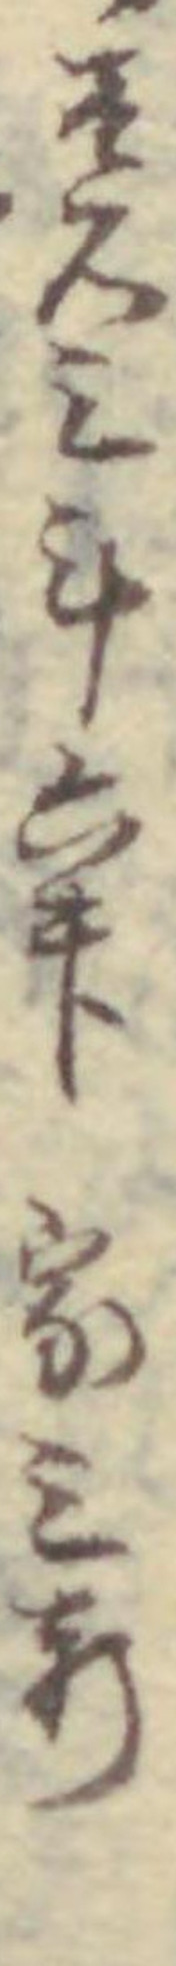高壱石三斗六升家三軒
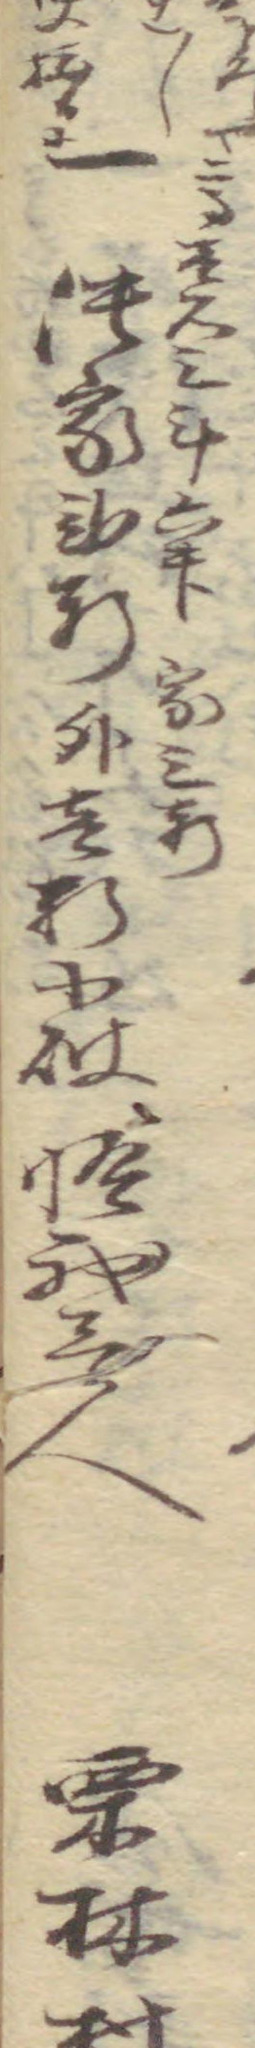一潰家弐軒外壱軒小破怪我壱人栗林村
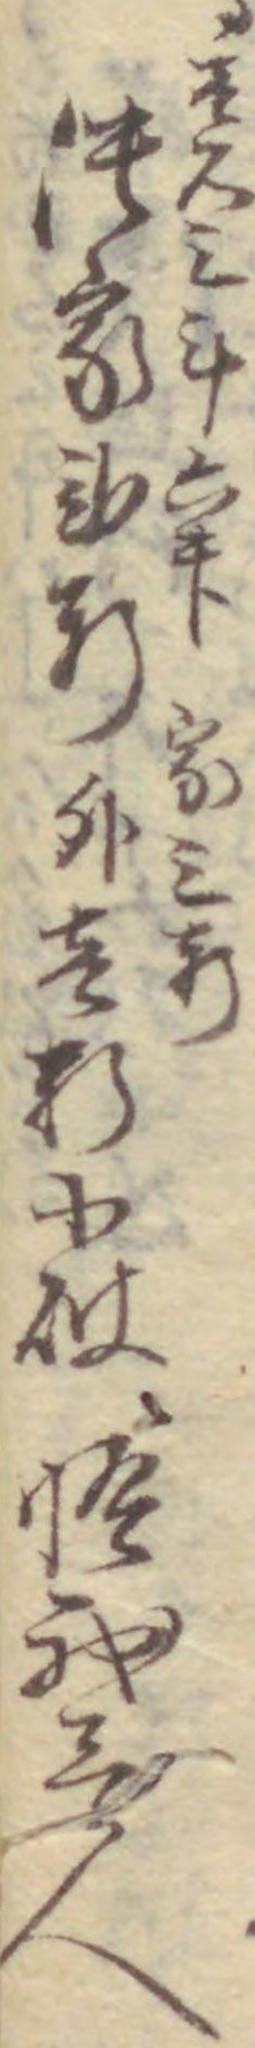一潰家弐軒外壱軒小破怪我壱人栗林村
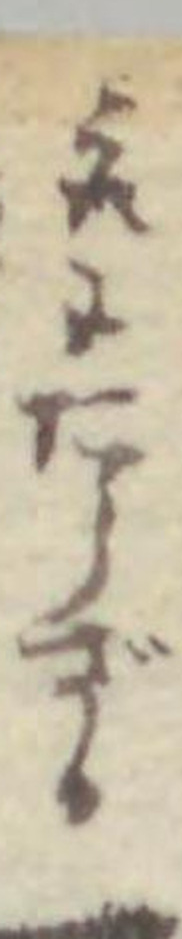取にたらざる
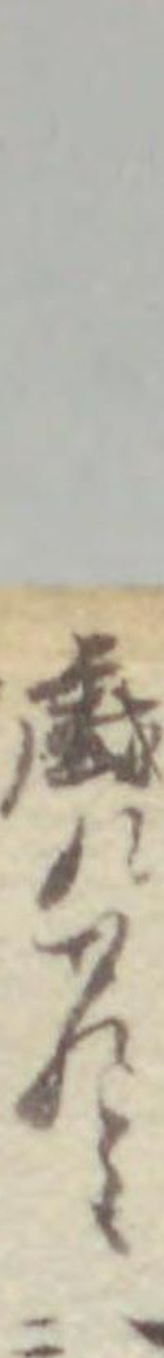戯れなれとも
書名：鶯宿雑記. 巻199-200
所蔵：国立国会図書館 National Diet Library, JAPAN
